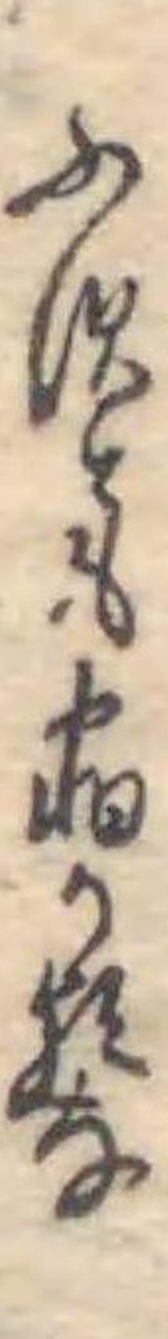ふすとも宿かるな
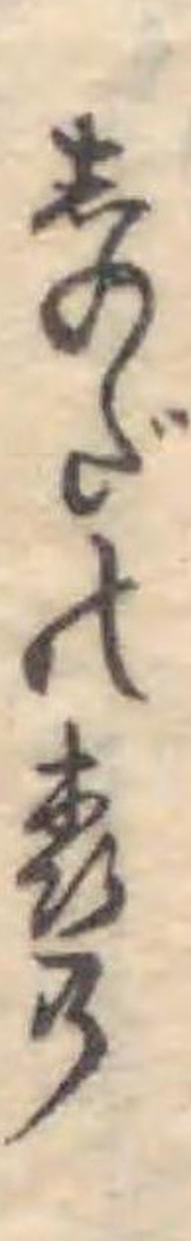しのだの森の
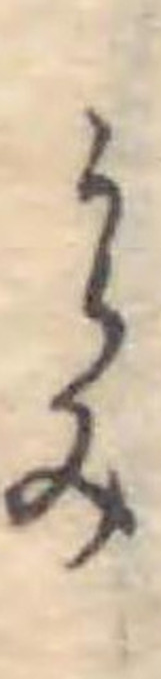うらみ
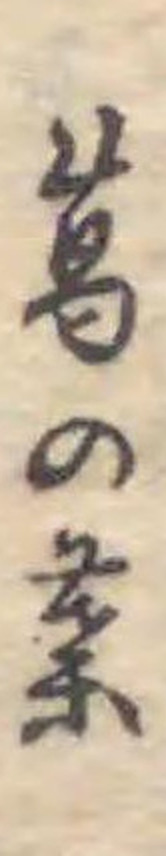葛の葉
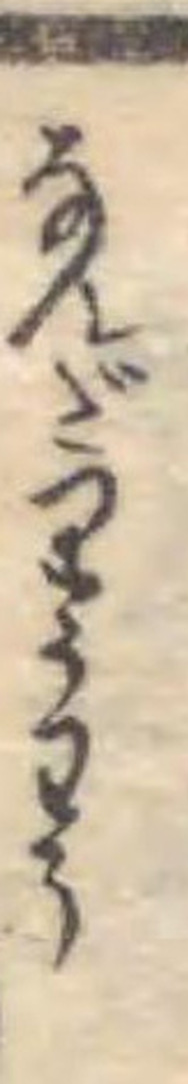なんだりうわう
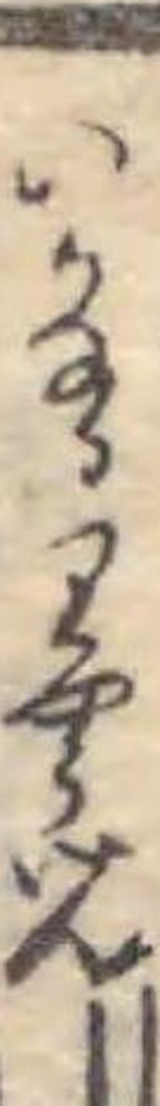いかなるりやうけん
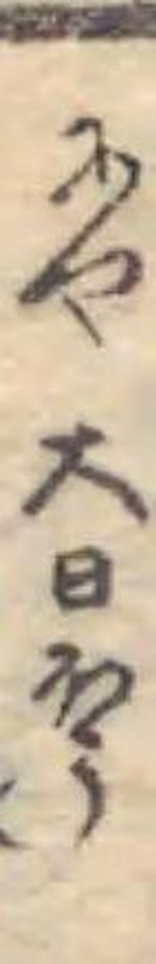にや大日ほう
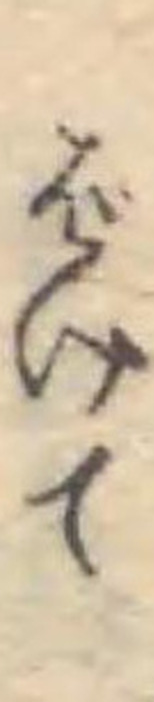ばけて
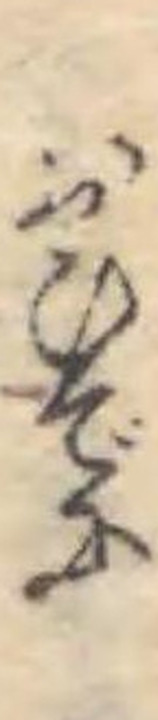おひでに
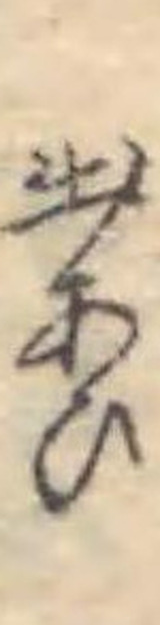出会ひ
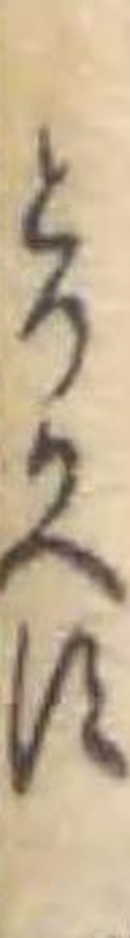とりかへす
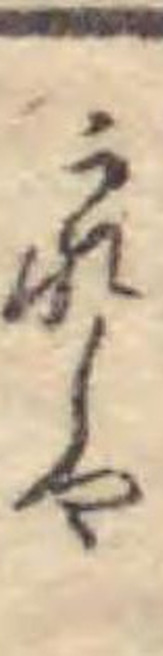うれしや
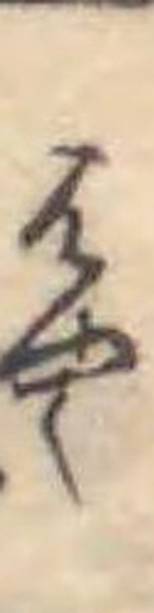はやく
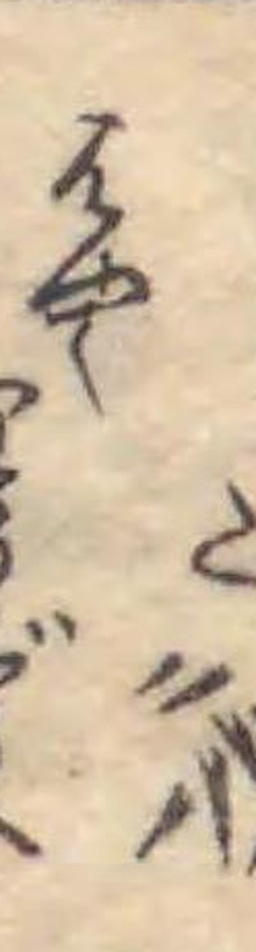はやく
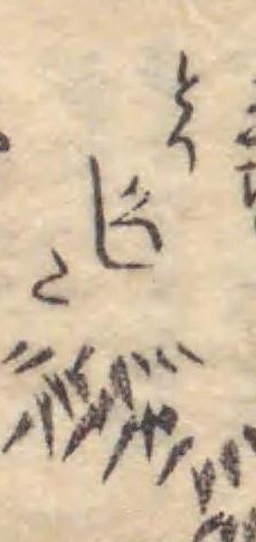とりかへす
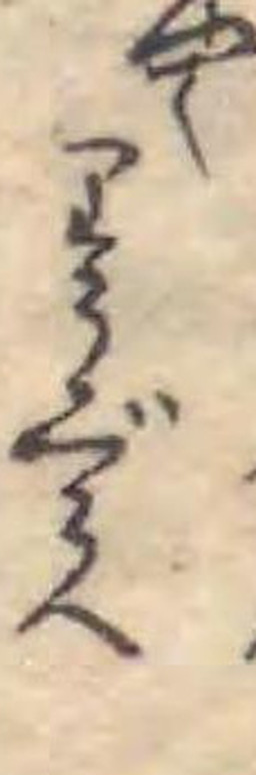りうぐうへ
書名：鐘入七人化粧 : 3巻
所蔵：国立国会図書館 National Diet Library, JAPAN
